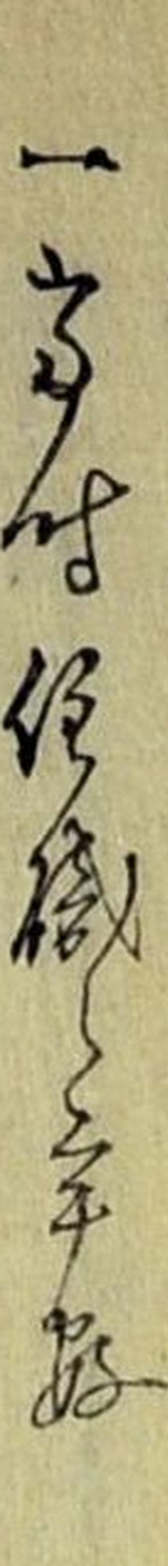一当時住職之年数
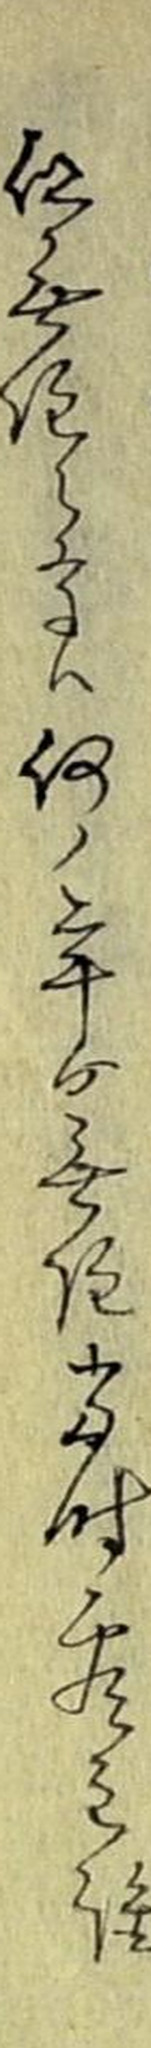但無住之寺ハ何ノ年ゟ無住当時頼主誰
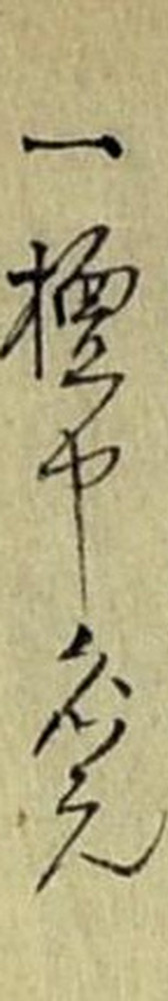一檀中名元
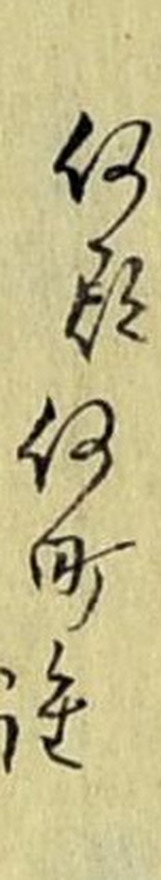何郡何町誰
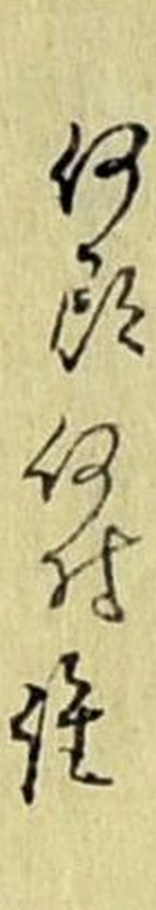何郡何村誰
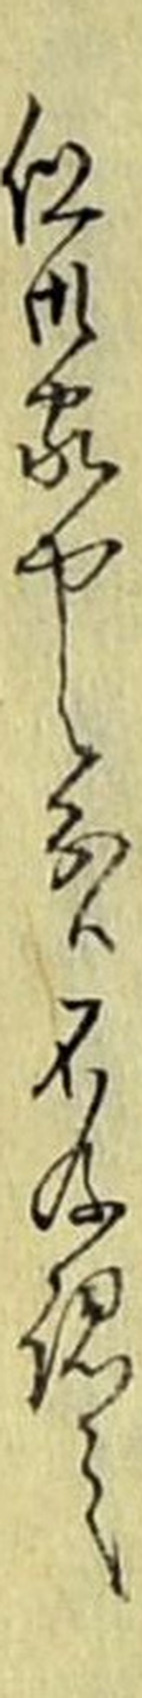但御家中之分ハ不及認之
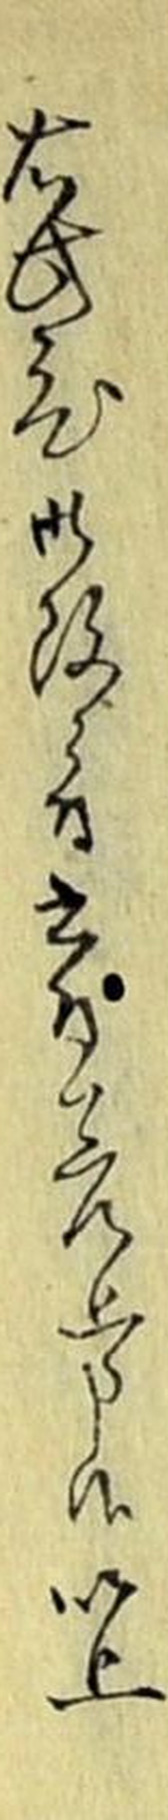右此度御改ニ付書付差上申候以上

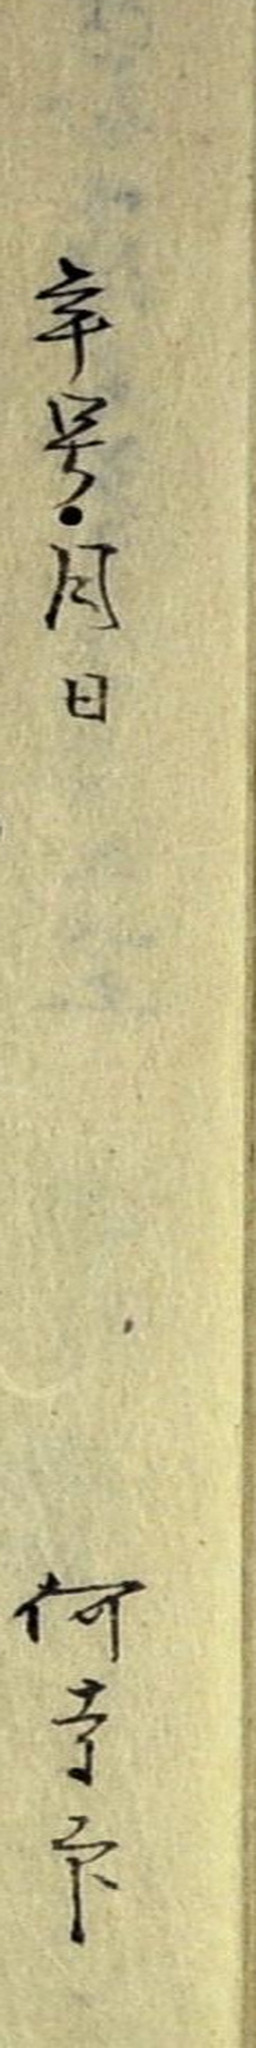年号月日何寺印
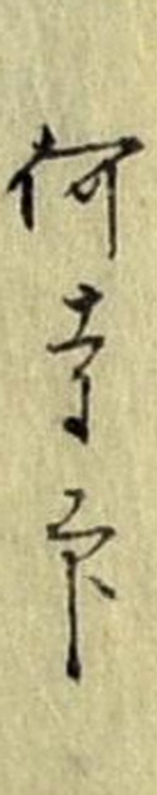何寺印
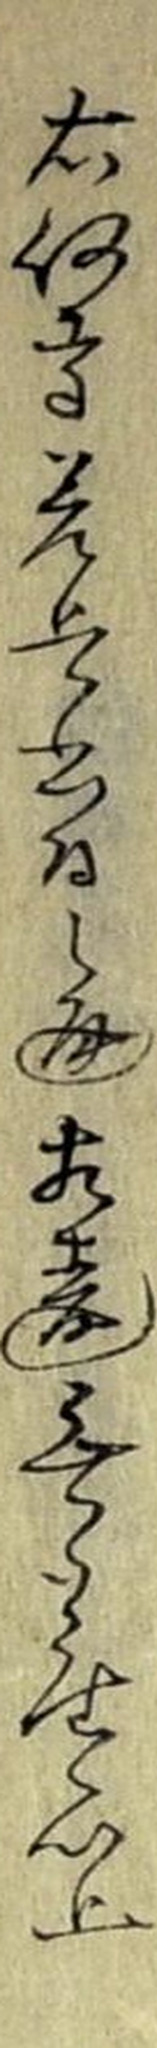右何寺差上候書付之通相違無御座候以上
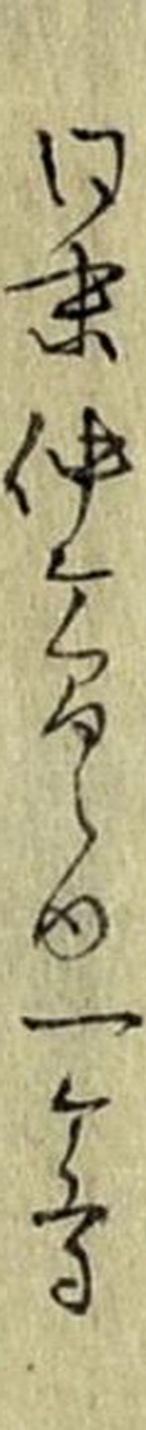同末仲ケ間之内一ケ寺
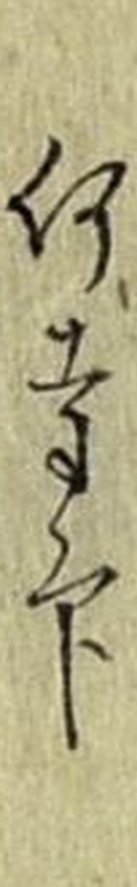何寺印
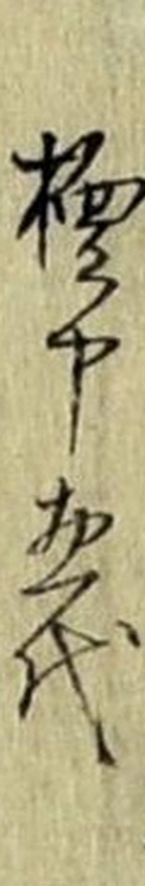檀中惣代
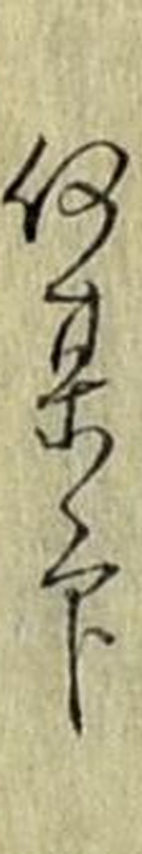何某印
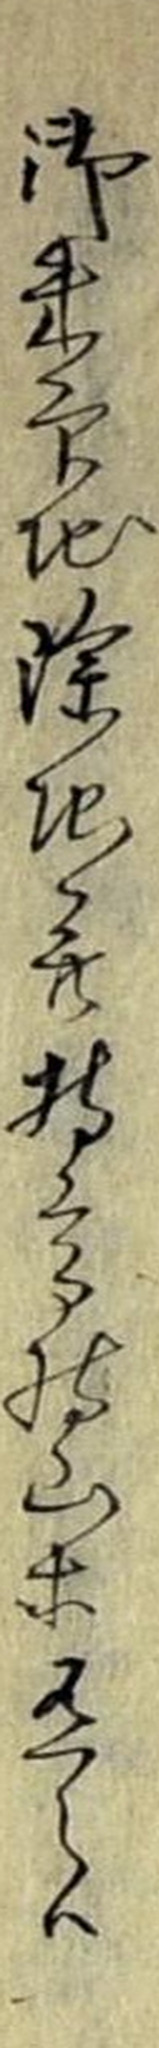御朱印地除地并持高持山等有之ハ
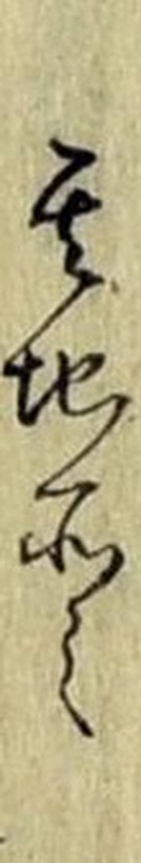其地所之
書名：命令之部 五
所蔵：福井県文書館 Fukui Prefectural Archives
